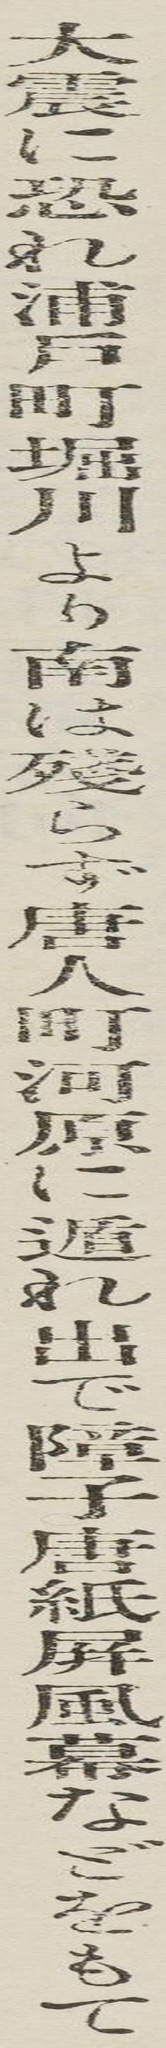大震に恐れ浦戸町堀川より南は残らず唐人町河原に遁れ出で障子唐紙屏風幕などをもて
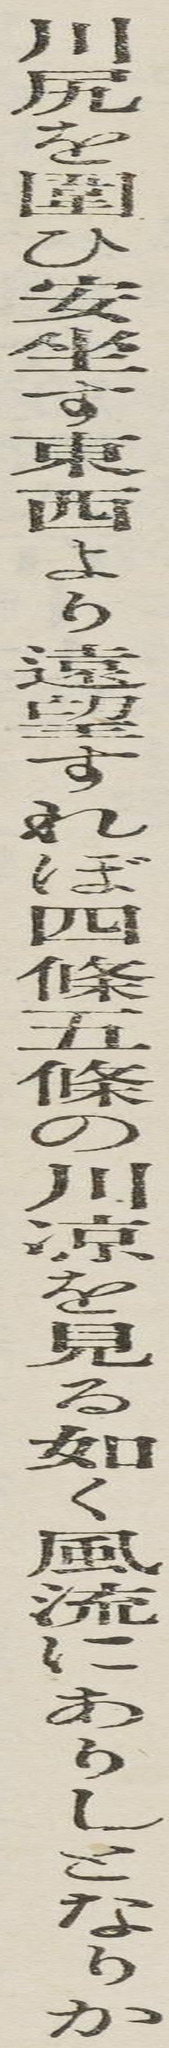川尻を囲ひ安坐す東西より遠望すれぼ四條五條の川涼を見る如く風流にありしとなりか
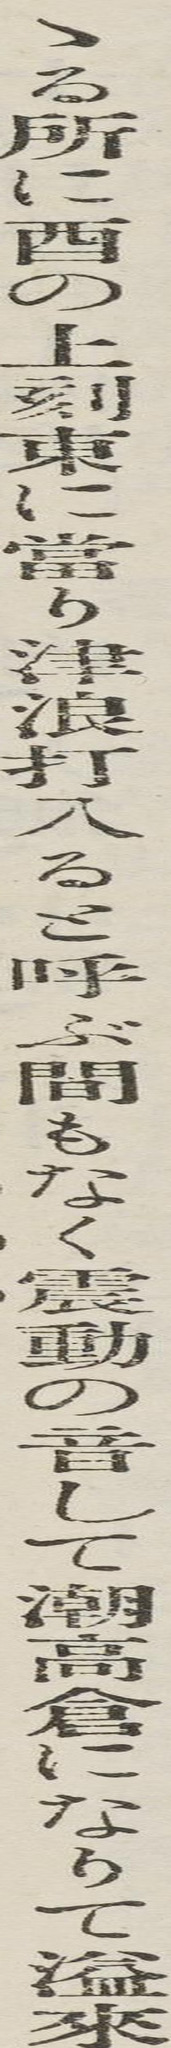ゝる所に酉の上刻東に当り津浪打入ると呼ぶ間もなく震動の音して潮高倉になりて溢来
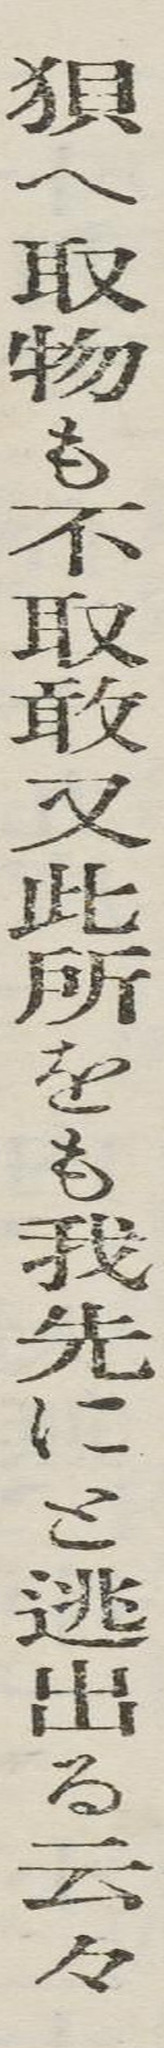狽へ取物も不取敢又此所をも我先にと逃出る云々
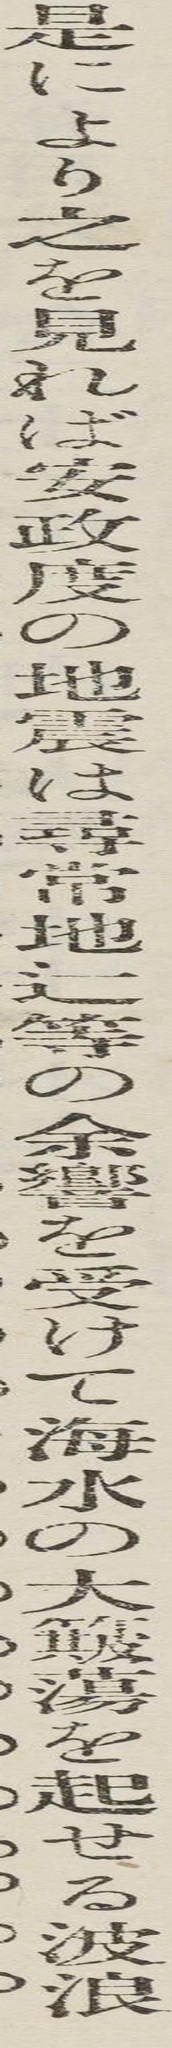是により之を見れば安政度の地震は尋常地辷等の余響を受けて海水の大簸蕩を起せる波浪
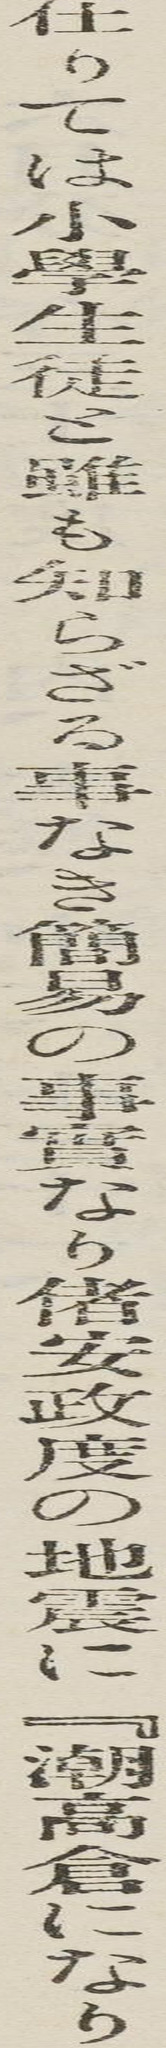在りては小学生徒と雖も知らざる事なき簡易の事実なり偖安政度の地震に『潮高倉になり
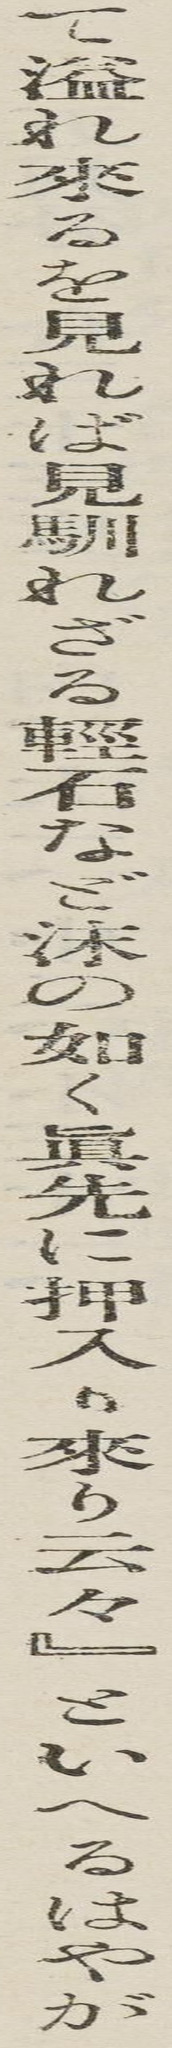て溢れ来るを見れば見馴れざる軽石など沫の如く真先に押入り来り云々』といへるはやが
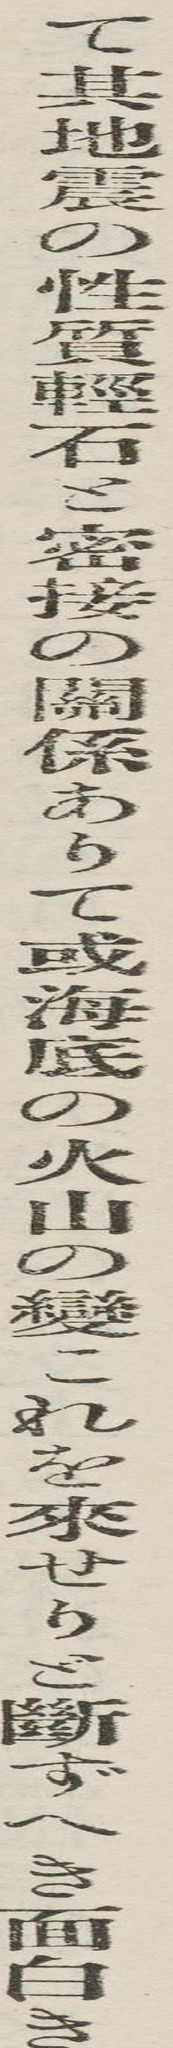て其地震の性質軽石と密接の関係ありて或海底の火山の変これを来せりと断ずへき面白き
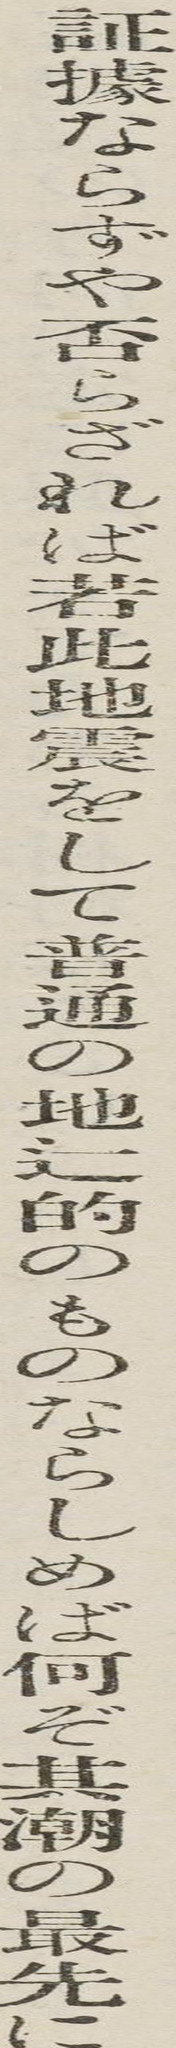証拠ならずや否らざれば若此地震をして普通の地辷的のものならしめば何ぞ其潮の最先に
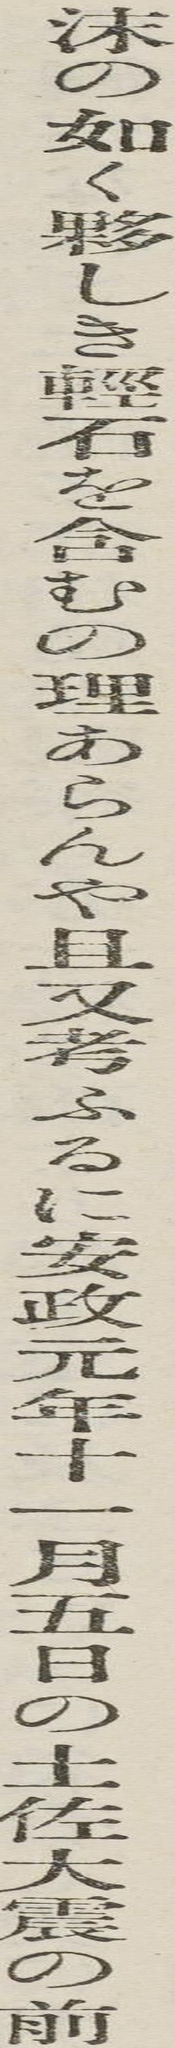沫の如く夥しき軽石を含むの理あらんや且又考ふるに安政元年十一月五日の土佐大震の前
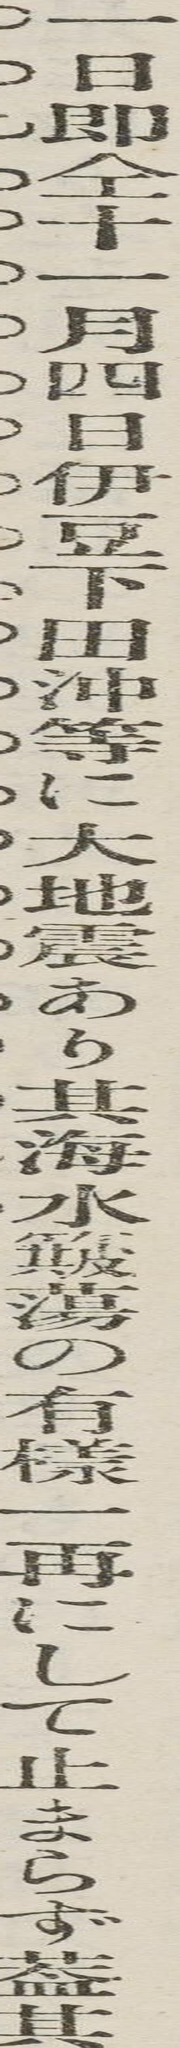一日即同十一月四日伊豆下田沖等に大地震あり其海水簸蕩の有様一再にして止まらず蓋其
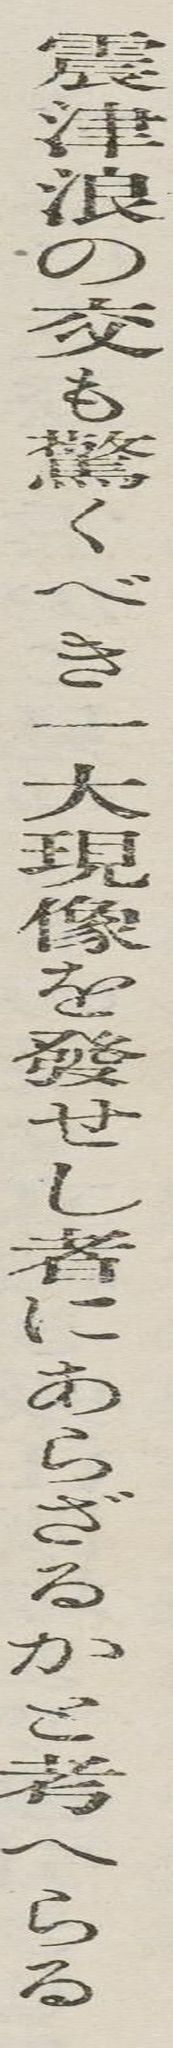震津浪の交も驚くべき一大現像を発せし者にあらざるかと考へらる
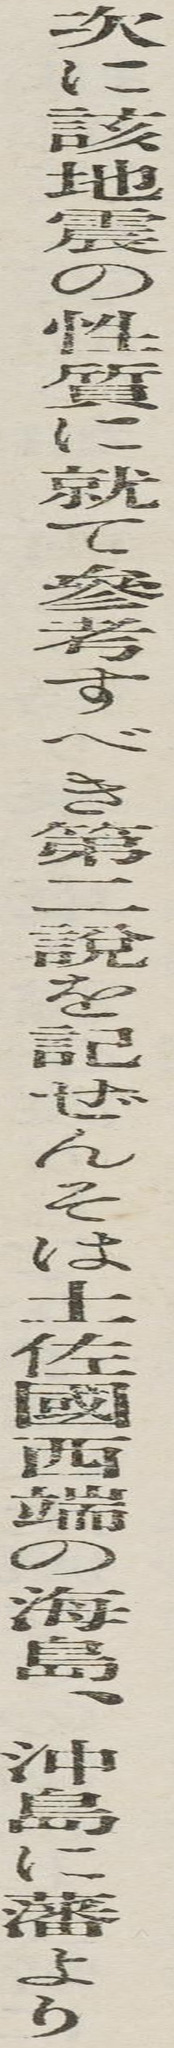次に該地震の性質に就て参考すべき第二説を記ぜんそは土佐国西端の海島、沖島に藩より
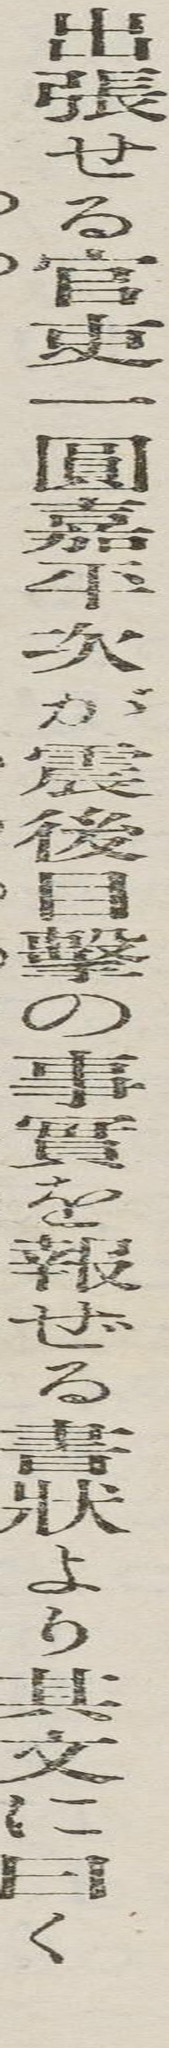出張せる官吏一円嘉平次が震後目撃の事実を報ぜる書状より其文に曰く
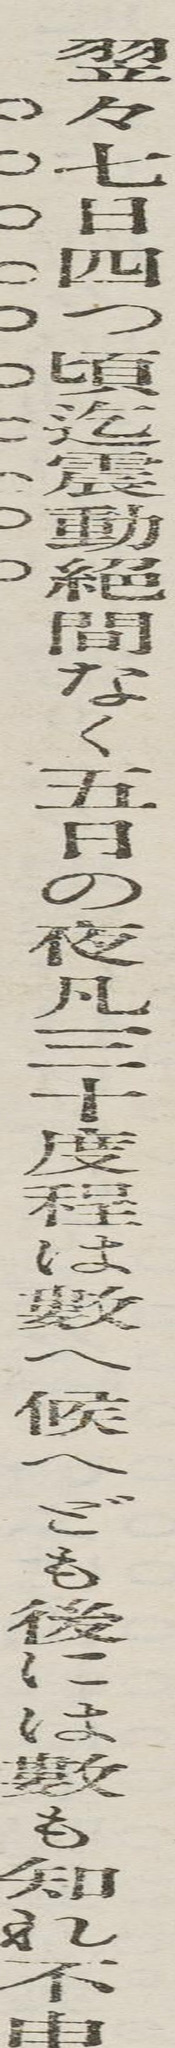翌々七日四つ頃迄震動絶間なく五日の夜凡三十度程は数へ候へども後には数も知れ不申
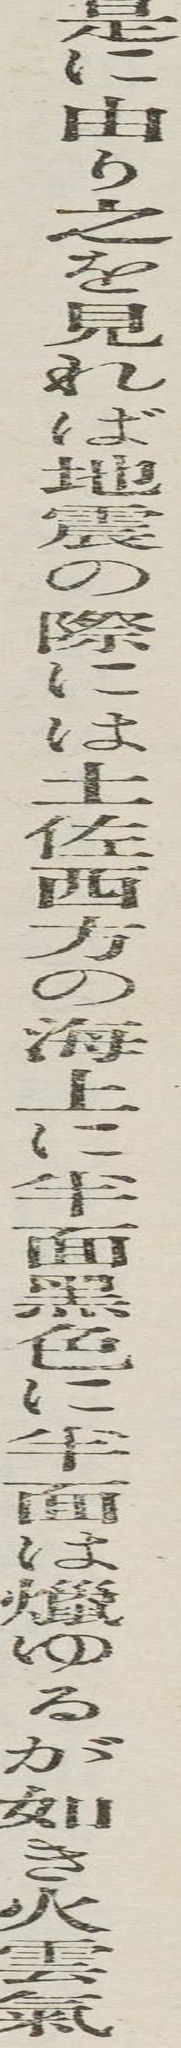是に由り之を見れば地震の際には土佐西方の海上に半面黒色に半面は爉ゆるが如き火雲気
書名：土佐古今ノ地震
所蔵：東京大学地震研究所図書室 Earthquake Research Institute Library, The University of Tokyo, JAPAN
